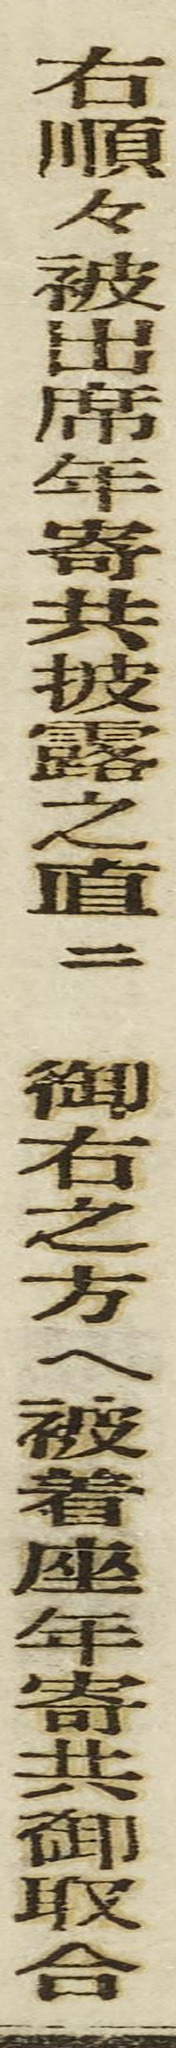右順々被出席年寄共披露之直ニ御右之方へ被着座年寄共御取合
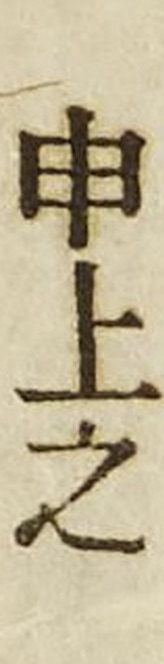申上之

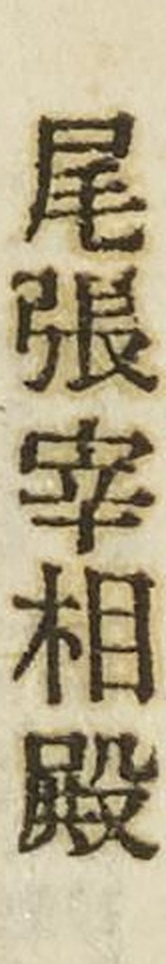尾張宰相殿
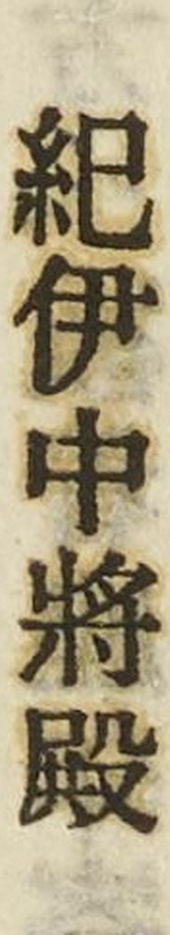紀伊中将殿
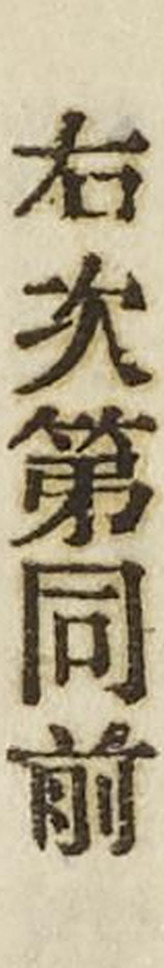右次第同前
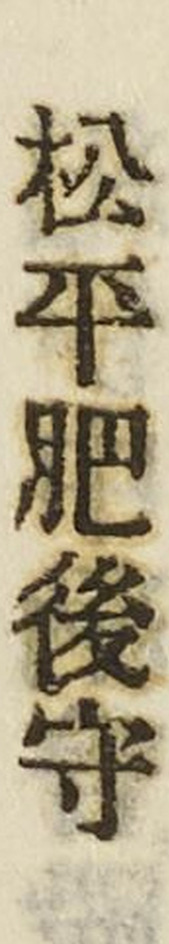松平肥後守
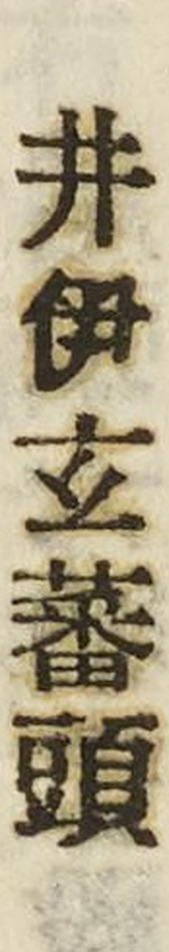井伊玄蕃頭
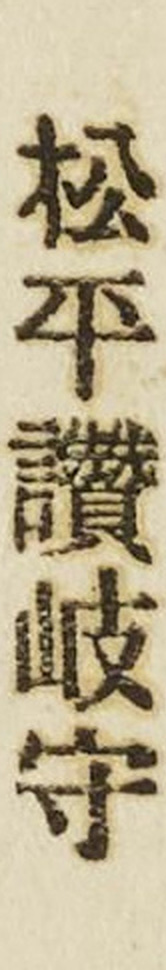松平讃岐守
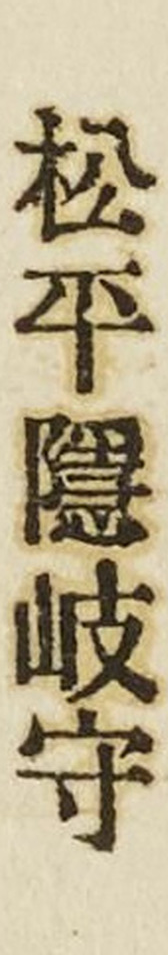松平隠岐守
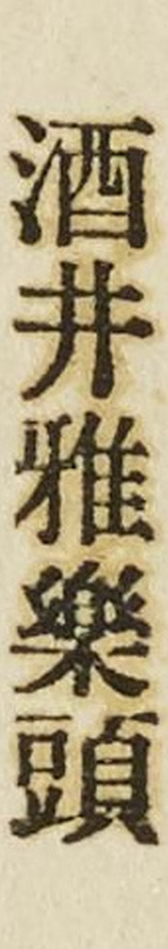酒井雅樂頭
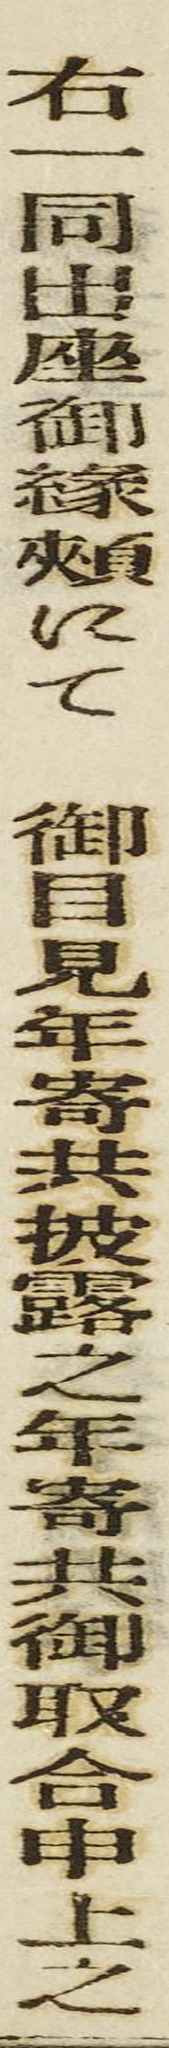右一同出座御縁頬にて御目見年寄共披露之年寄共御取合申上之
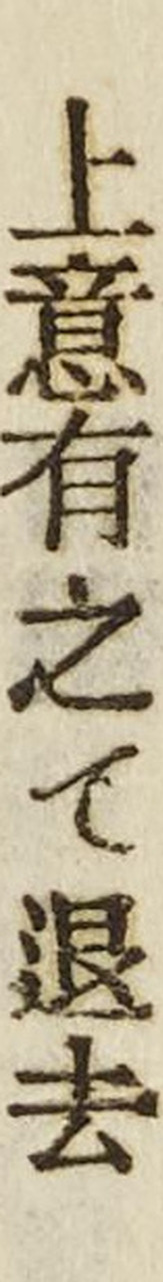上意有之て退去
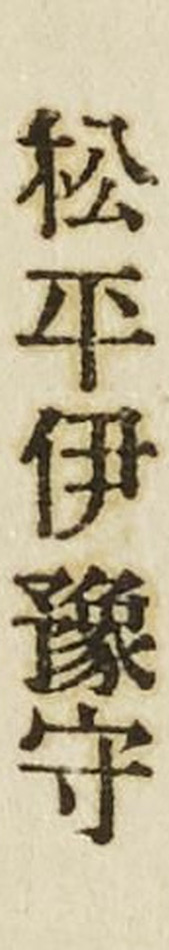松平伊予守
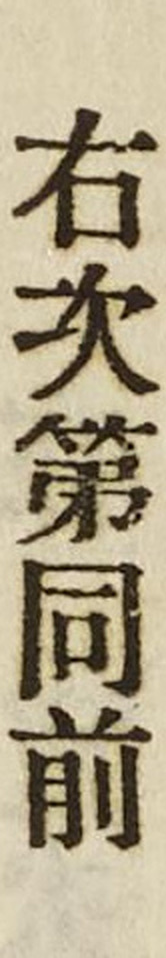右次第同前
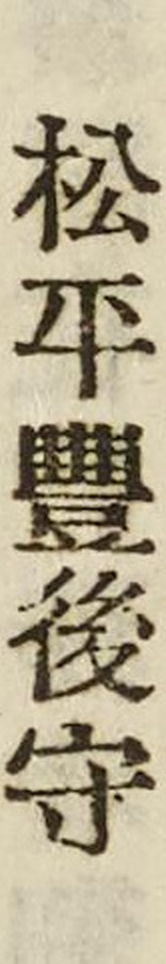松平豊後守
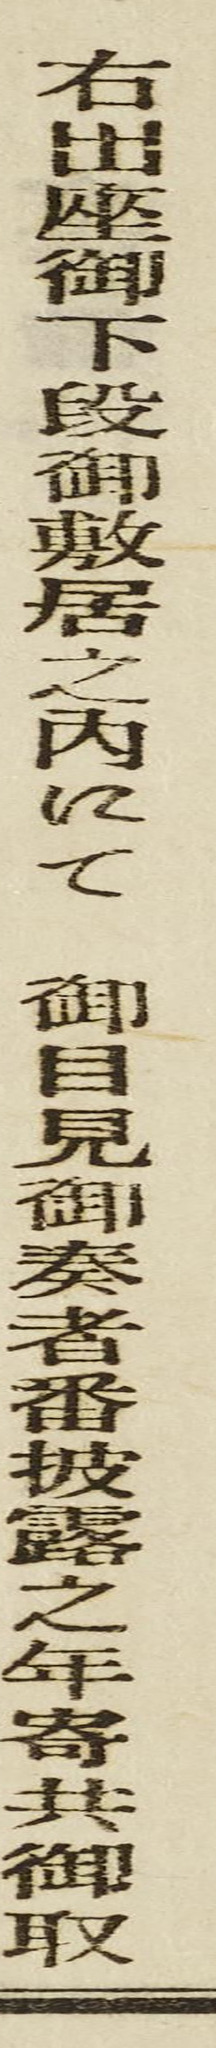右出座御下段御敷居之内にて御目見御奏者番披露之年寄共御取
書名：史籍集覽　朝鮮陣古文・細井廣澤記・颶風紀事・天明七年將軍宣下次第書　全
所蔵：東京大学地震研究所図書室 Earthquake Research Institute Library, The University of Tokyo, JAPAN
